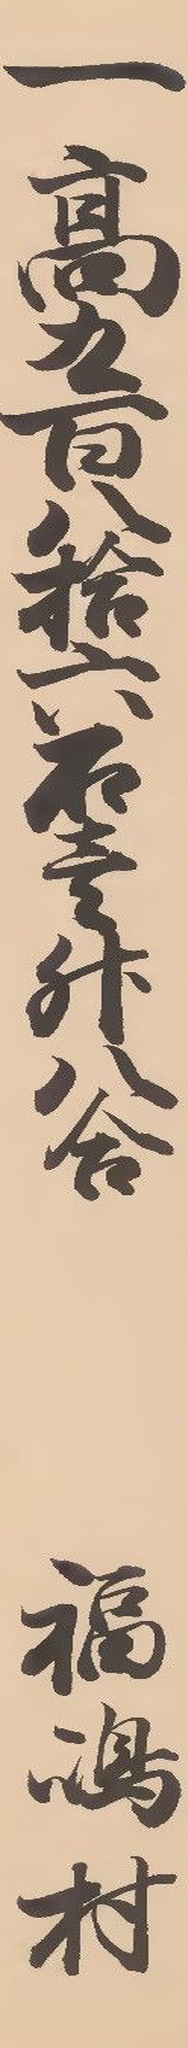一高九百八拾六石壱升八合福島村
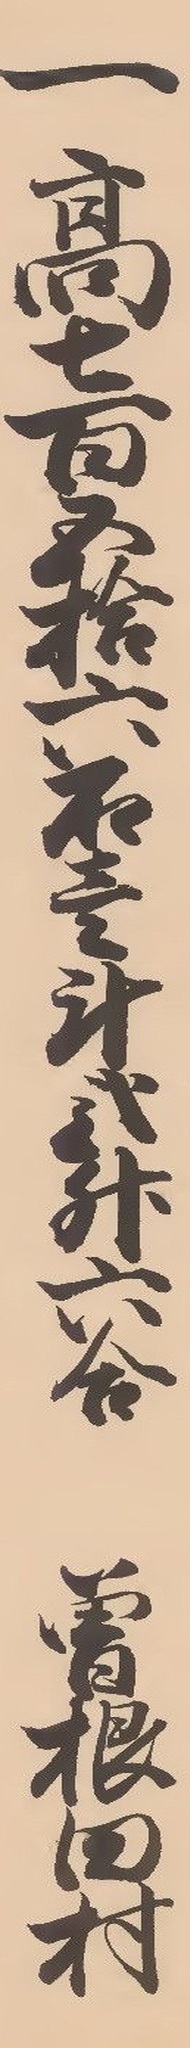一高七百五拾六石壱斗弐升六合曾根田村
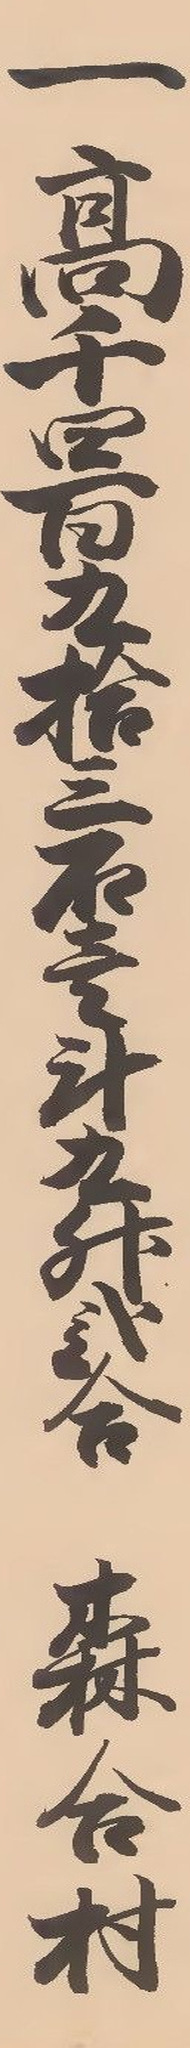一高千四百九拾三石壱斗九升弐合森合村
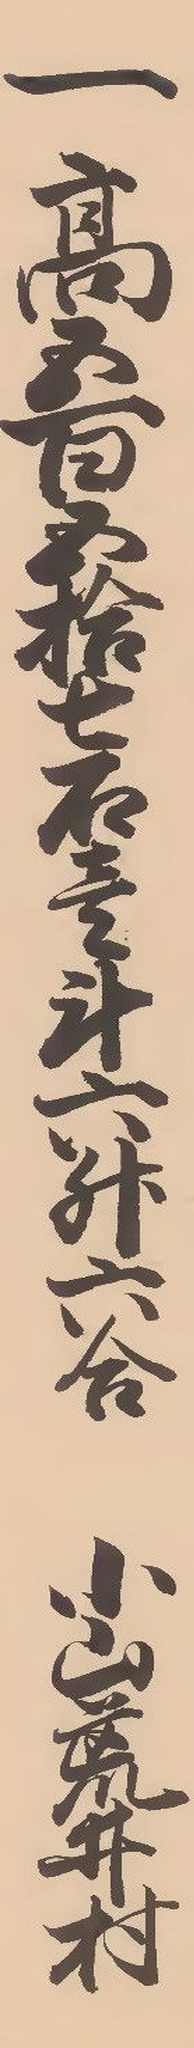一高五百五拾七石壱斗六升六合小山荒井村

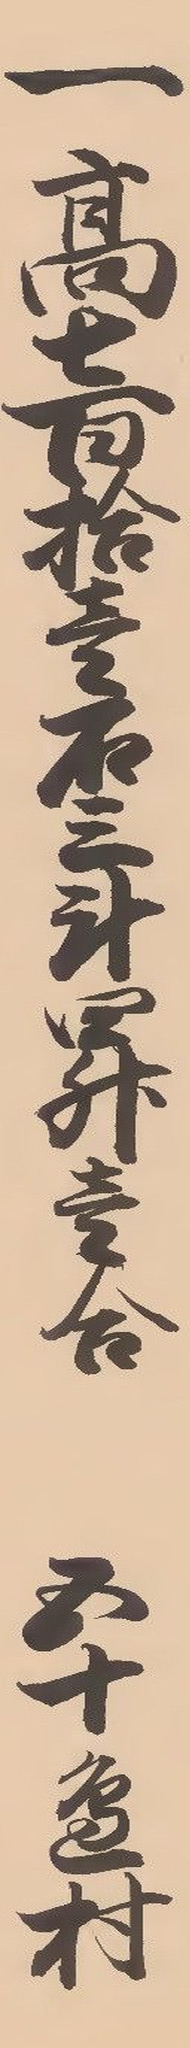一高七百拾壱石三斗四升壱合五十辺村
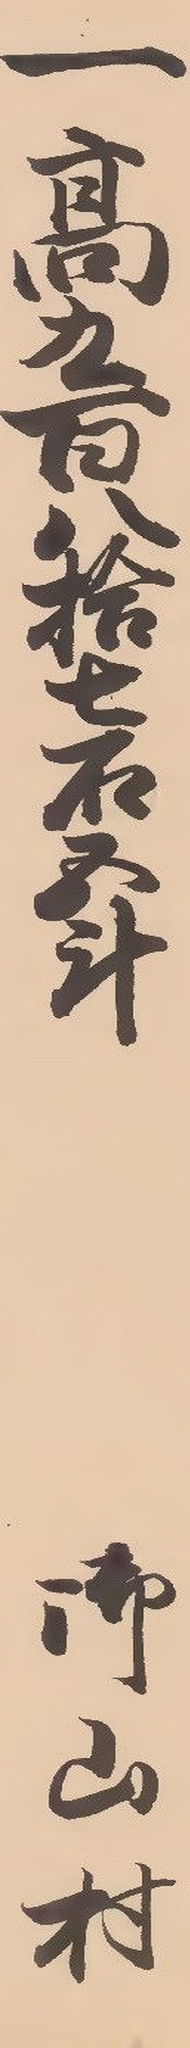一高九百八拾七石五斗御山村
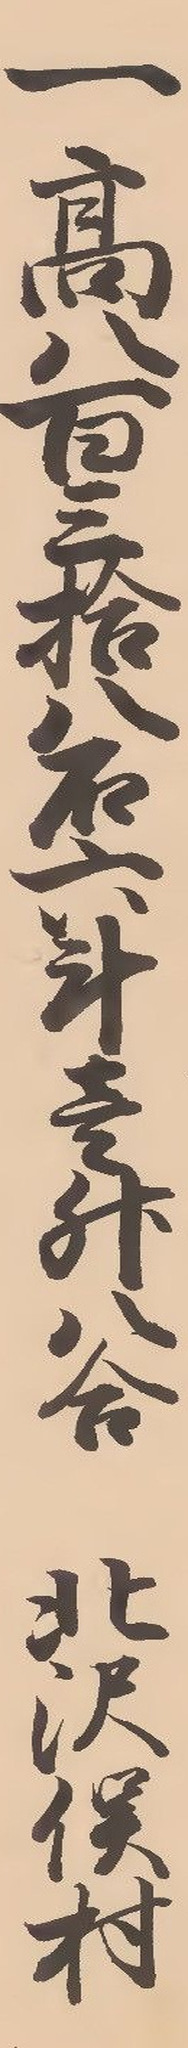一高八百三拾八石六斗壱升八合北沢俣村
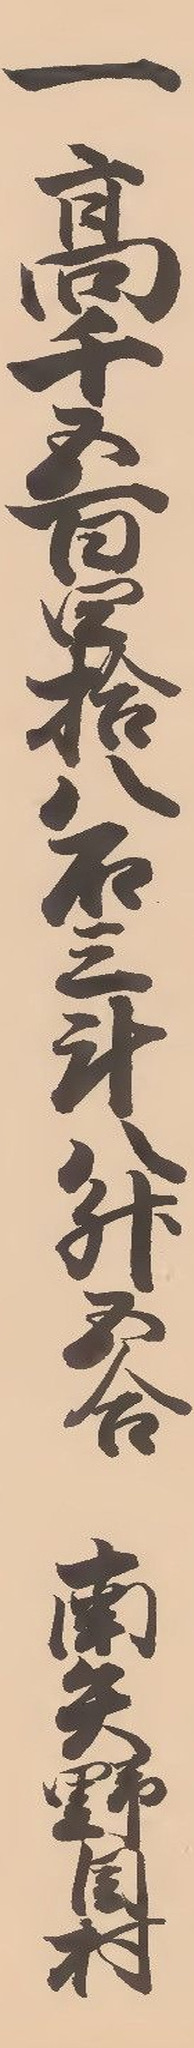一高千五百四拾八石三斗八升五合南矢野目村
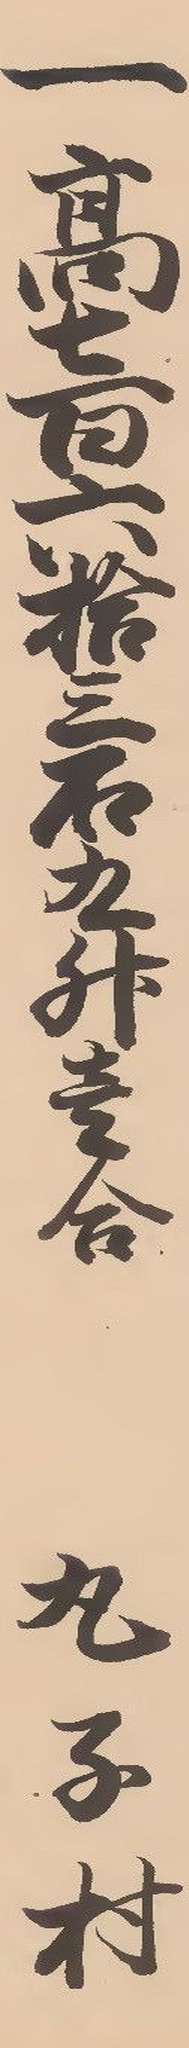一高七百六拾三石九升壱合丸子村
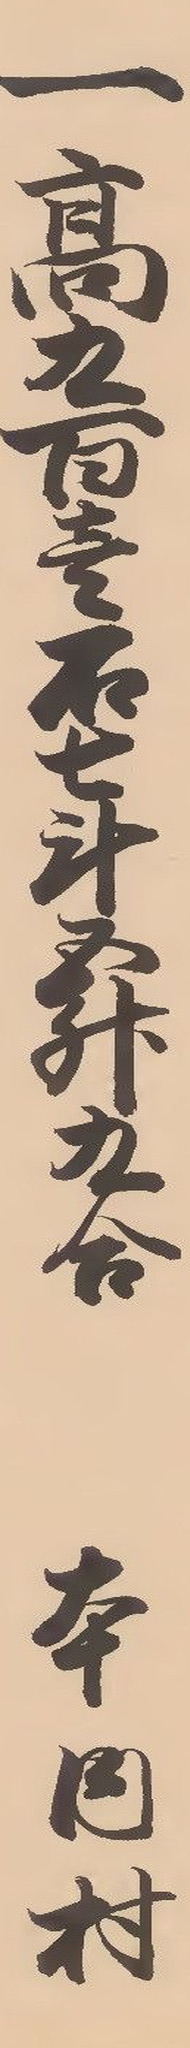一高九百壱石七斗五升九合本内村
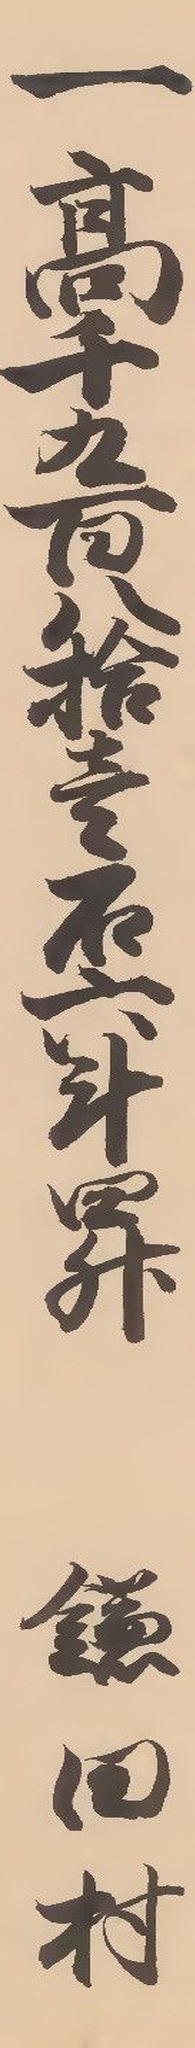一高千九百八拾壱石六斗四升鎌田村
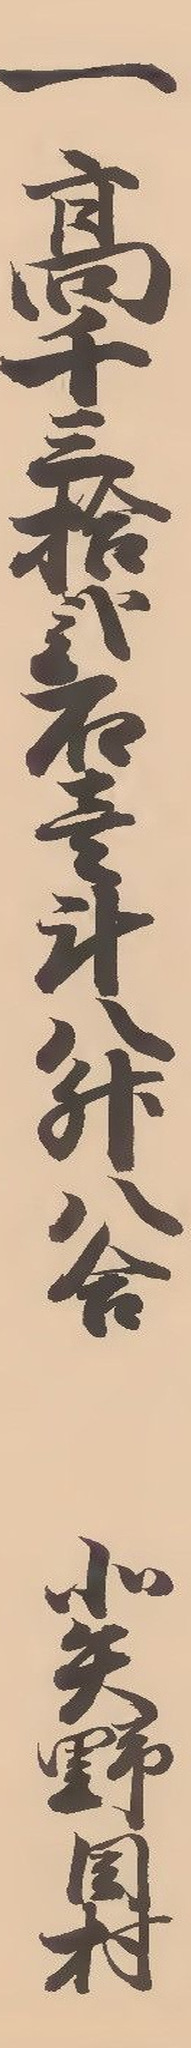一高千三拾弐石壱斗八升八合北矢野目村

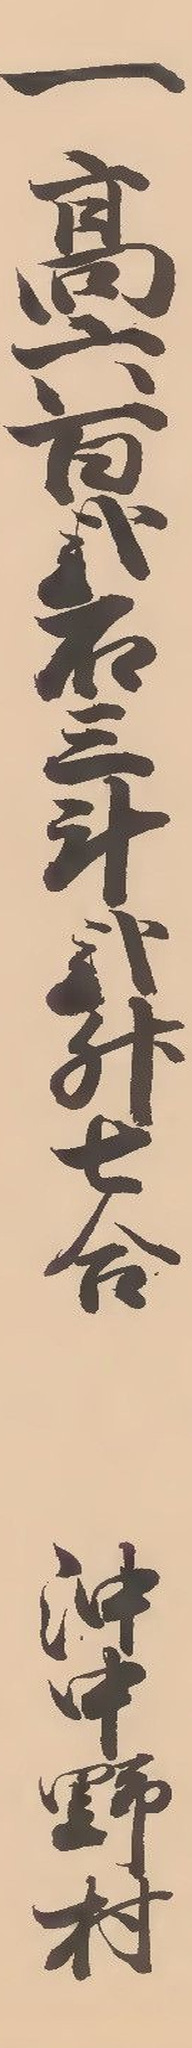一高六百弐石三斗弐升七合沖中野村
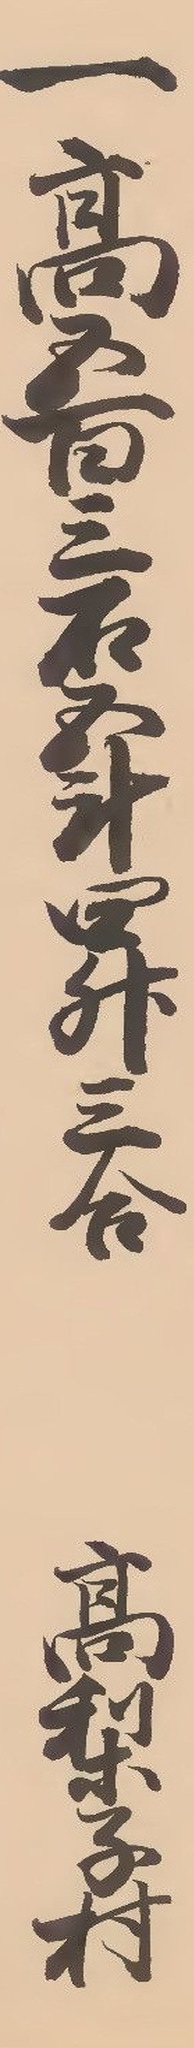一高五百三石五斗四升三合高梨子村
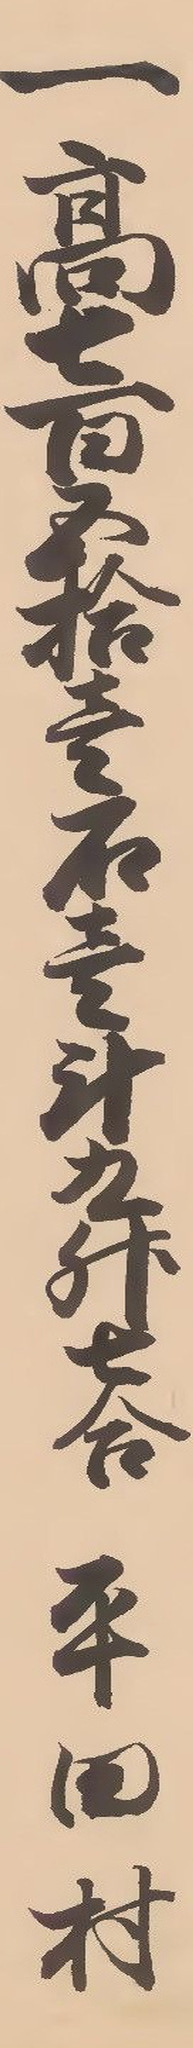一高七百五拾壱石壱斗九升七合平田村
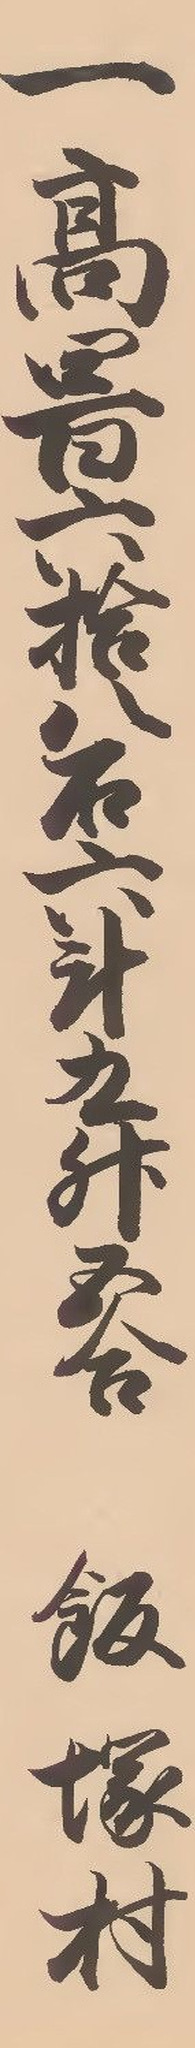一高四百六拾八石六斗九升五合飯塚村
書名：陸奥国郷帳　４
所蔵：国立公文書館 National Archives of Japan
